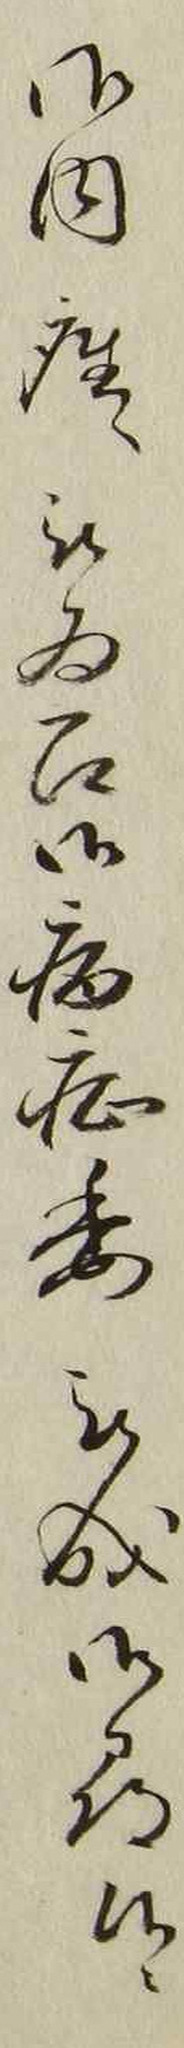御内座へ被為召御病症委被成御尋候ニ
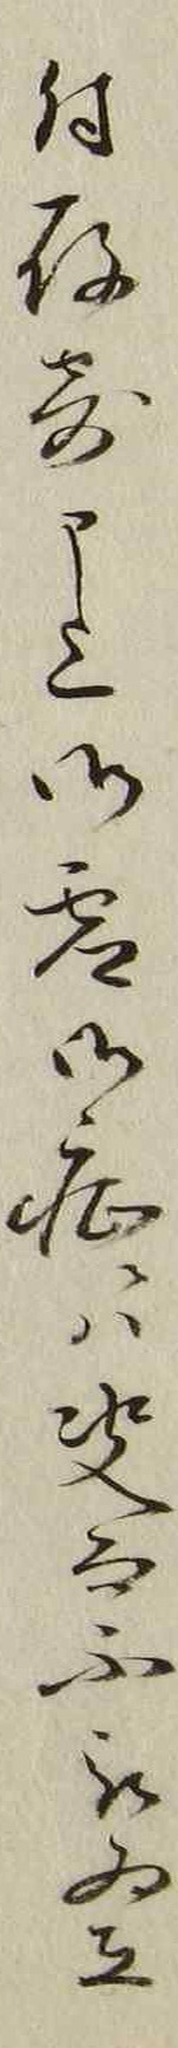付存寄申上御虚御病ニハ決而不被為在
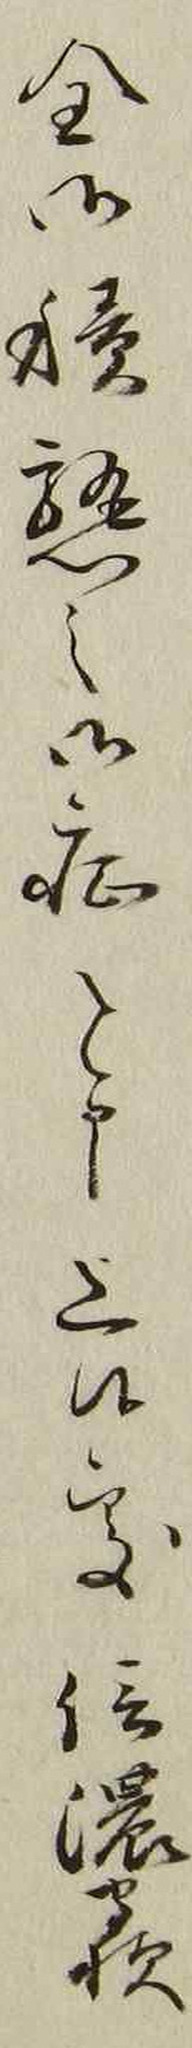全御積熟之御症と申上候処信濃守様
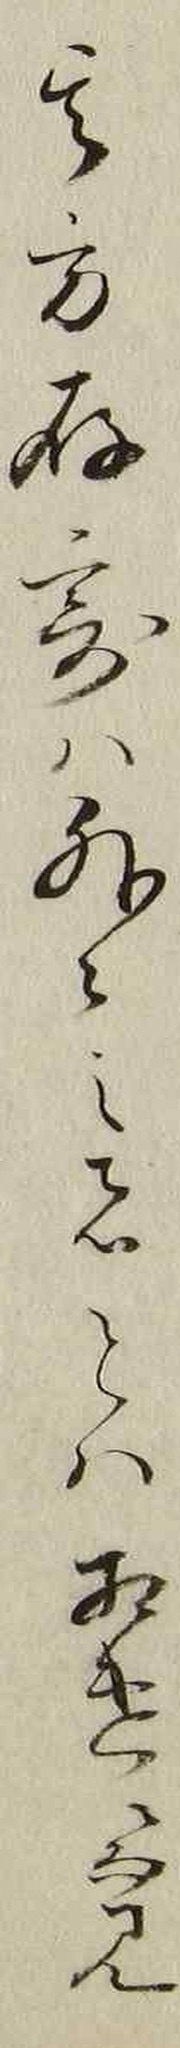其方存寄ハ外々之者とハ相違ニ而見
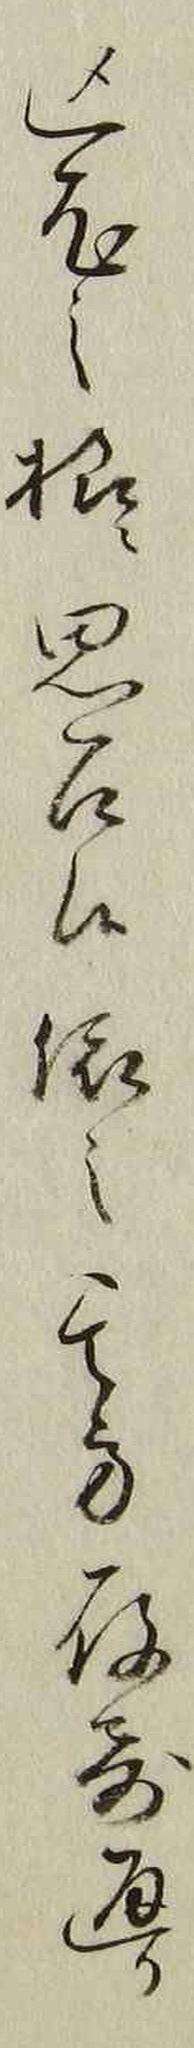込尤之様ニ思召候依之其方存寄通り
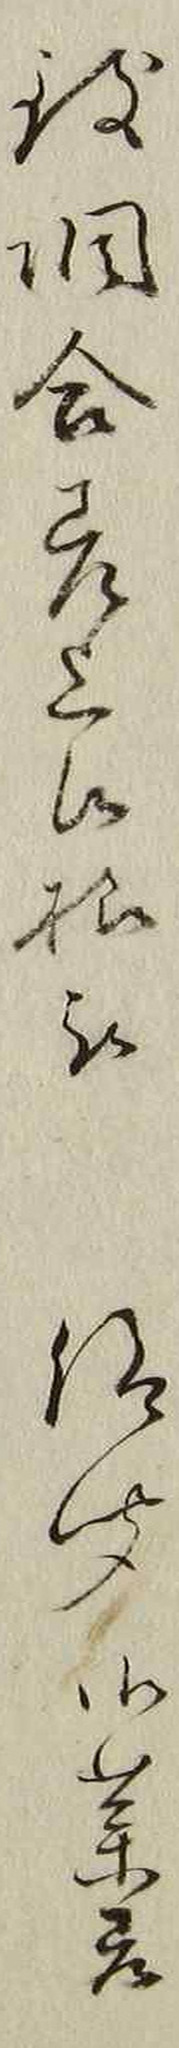致調合差上候様被仰聞候薬差
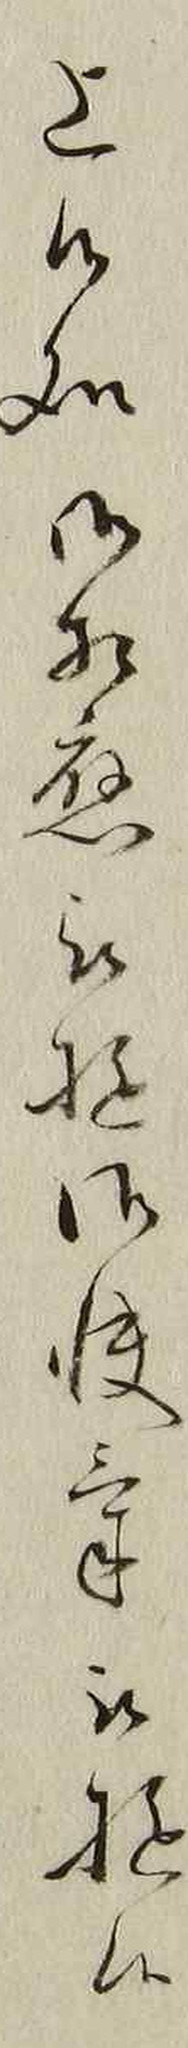上候処御相応被遊御快気被遊候
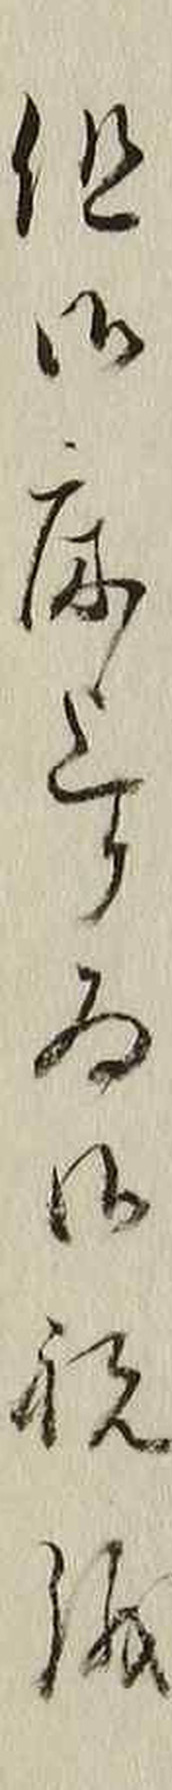但御床上ケ為御祝儀
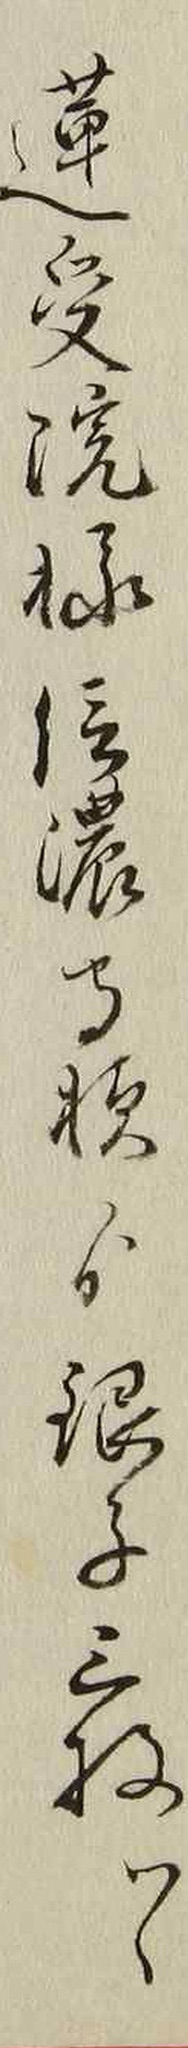蓮受院様信濃守様より銀子三枚ツヽ
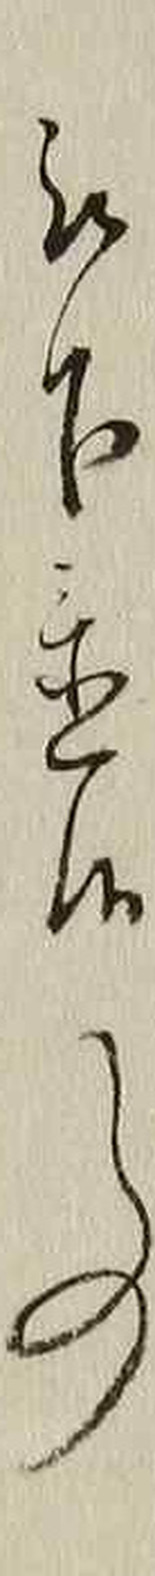被下置候事
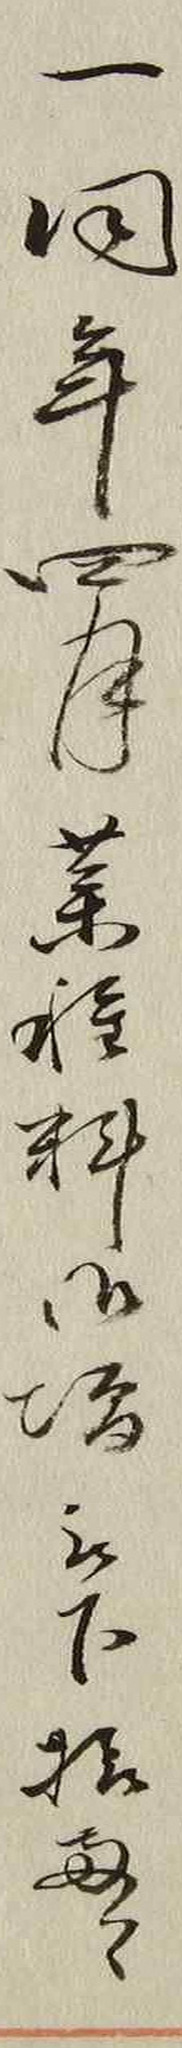一同年四月薬種料御増被下拾両ツヽ
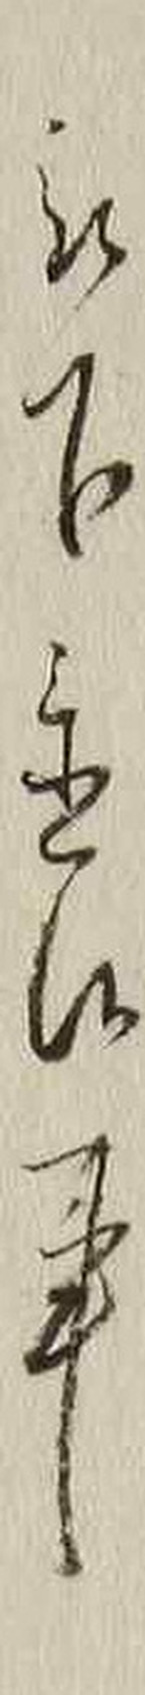被下置候事
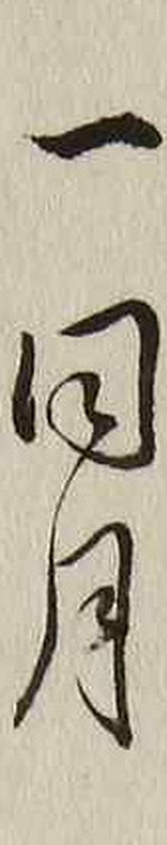一同月
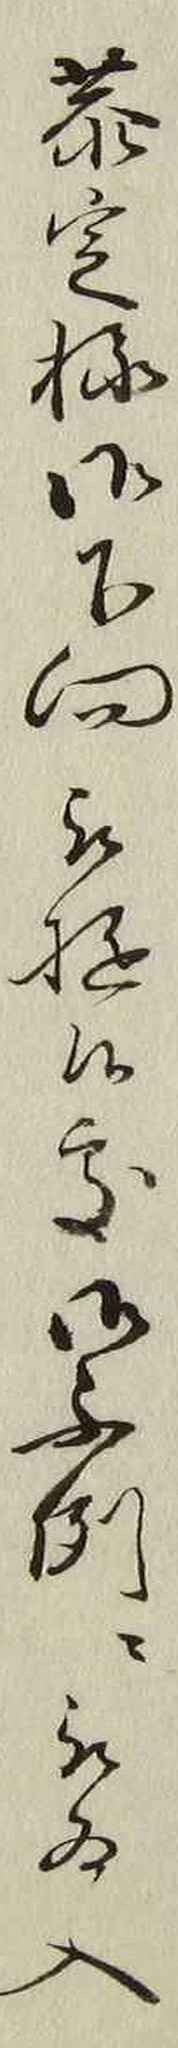恭定院様御下向被遊候処御不例ニ被為入
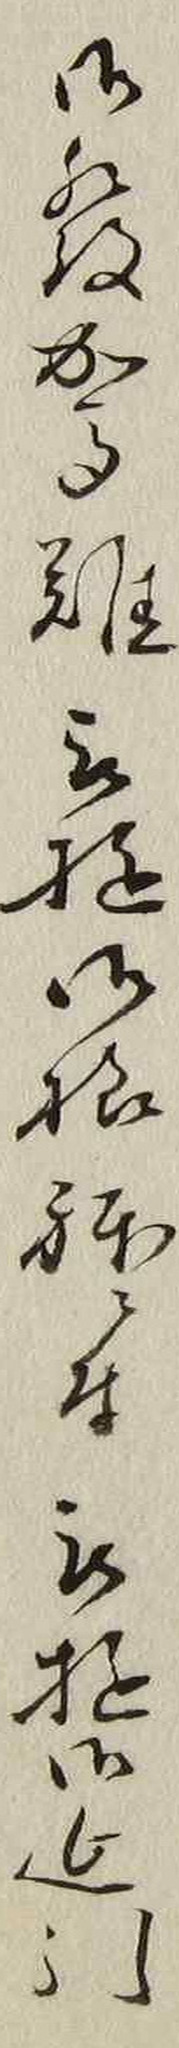御発駕難被遊御様体ニ付被遊御延引
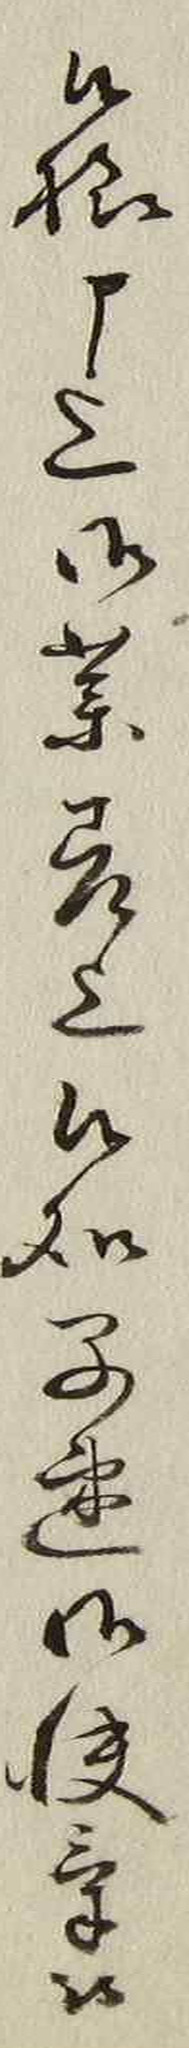候様申上御薬差上候処早速御快気被
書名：諸士系譜　巻之8　い之部8
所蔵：会津若松市立会津図書館
